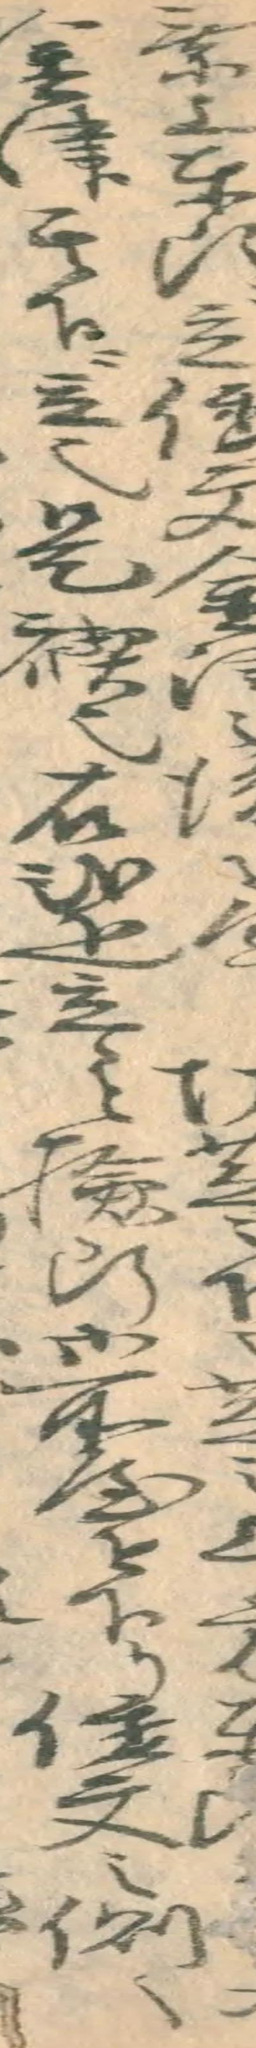金津其下ニ立也是禊也右弐疋立候と検断御所屋を下り倭文之側へ
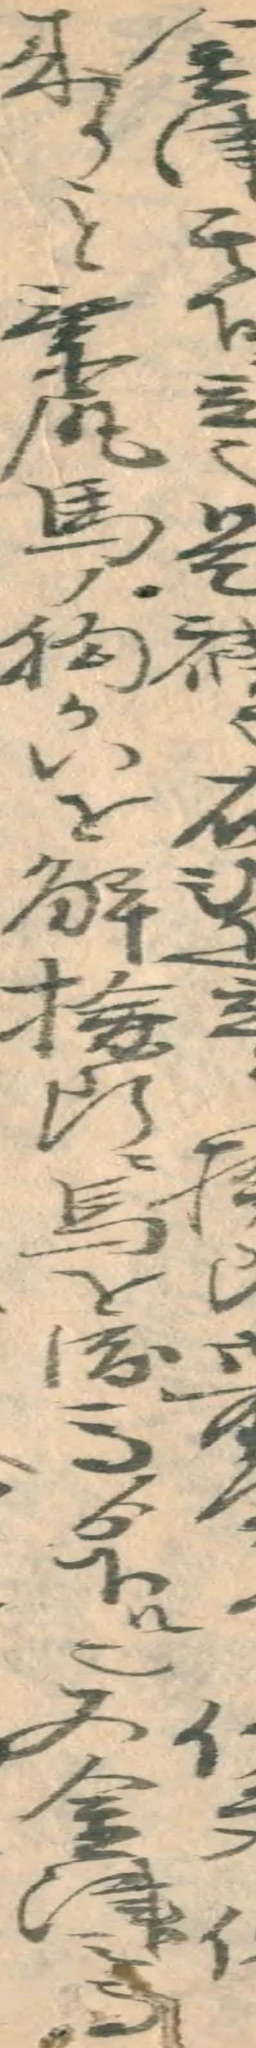来り候ハヽ乗尻馬ノ胸かいを解検断ニ馬を渡馬ゟ下ル也又金津之馬
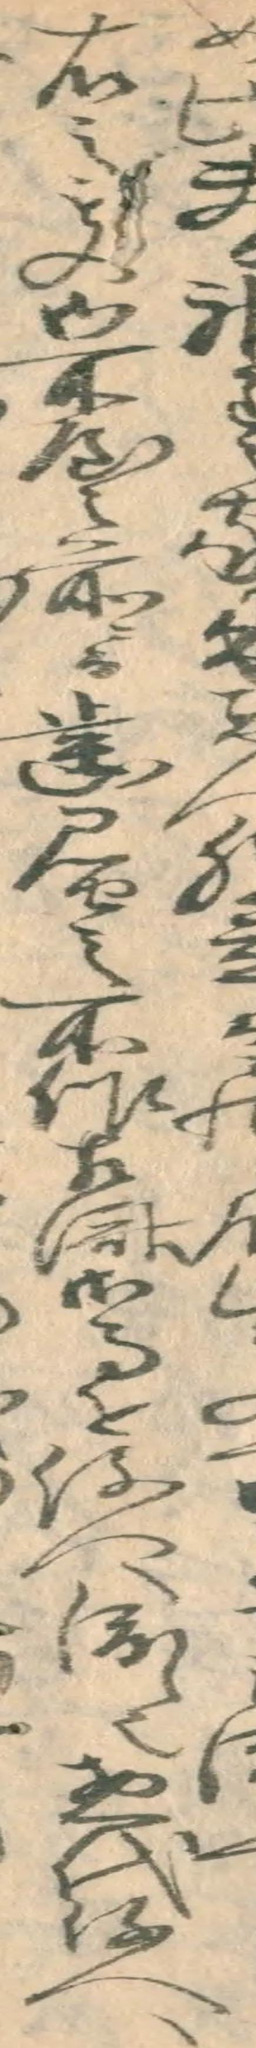右之もの御所屋之前ニ而歯見せ之所作相済御馬を役人へ渡候也惣代役人へ
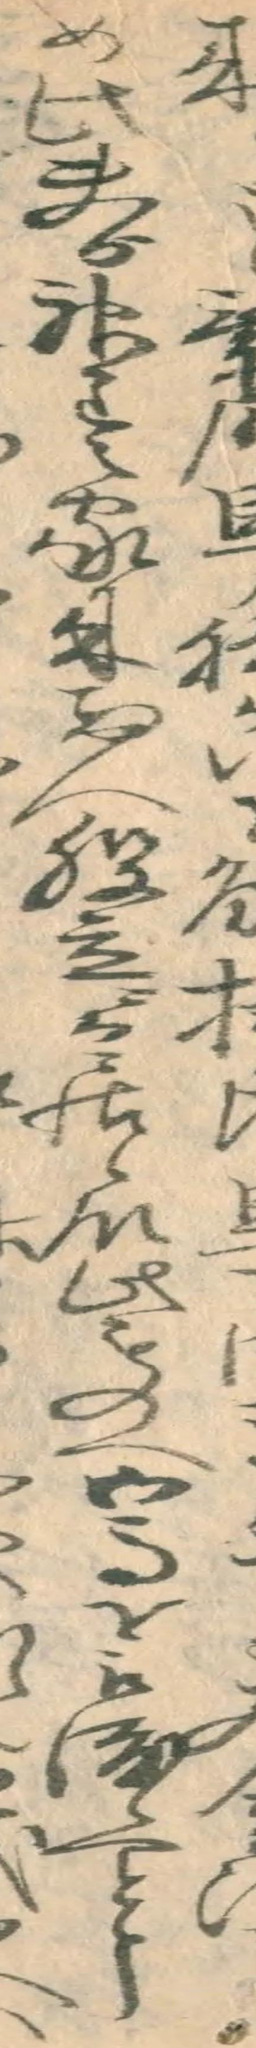如此夫ゟ神主之家来両人股立ニ而居候故此ものへ御馬を被渡候へと申
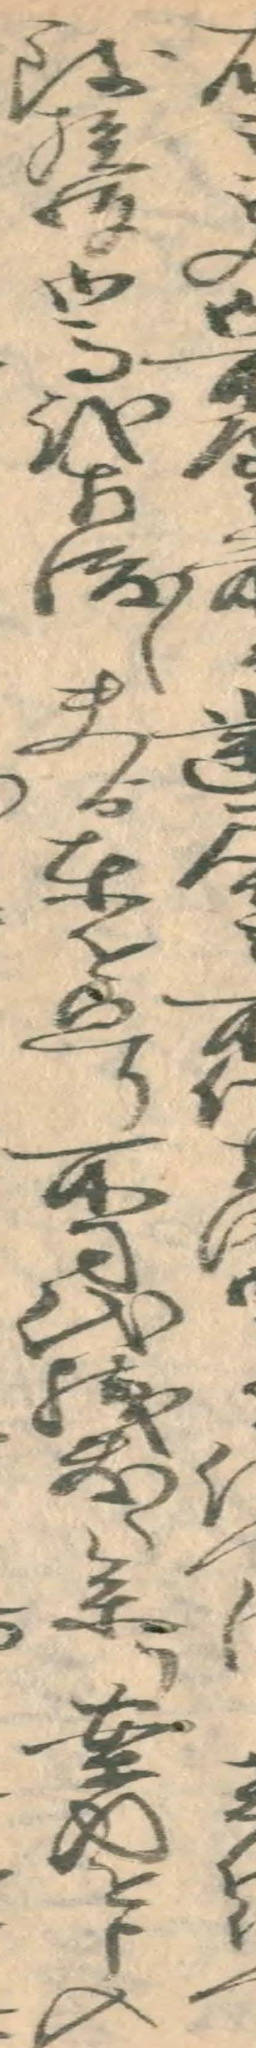致挨拶御馬を相渡し夫ゟ東を廻り所司代桟敷へ参り案内を申入
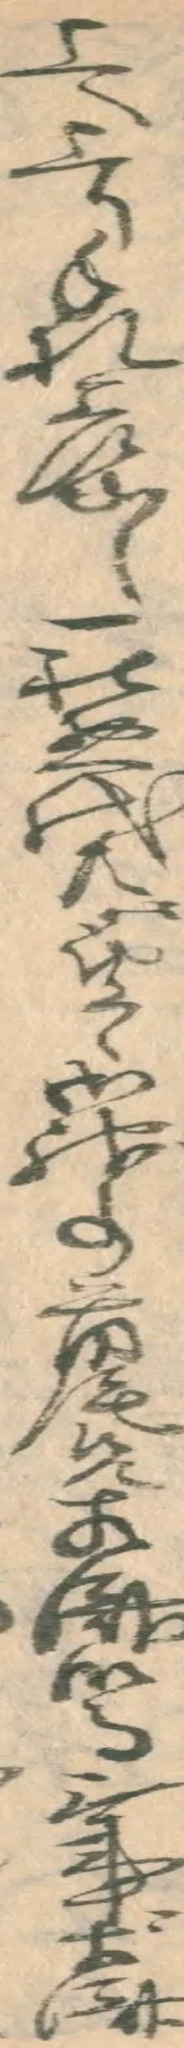上へ上り手札差出候一社惣代共ニ御座候御神事首尾克相済御馬無事ニ相済
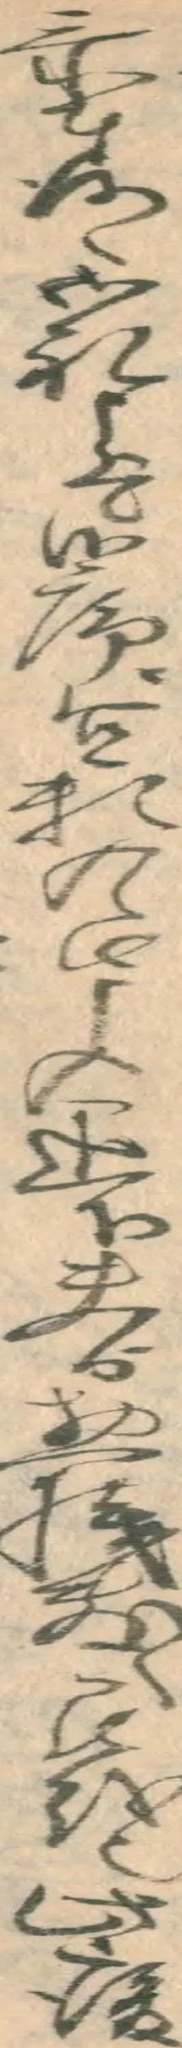忝奉存候御礼申上候御序ニ宜頼入候由申入退下夫ゟ惣桟敷へ罷越也此已後
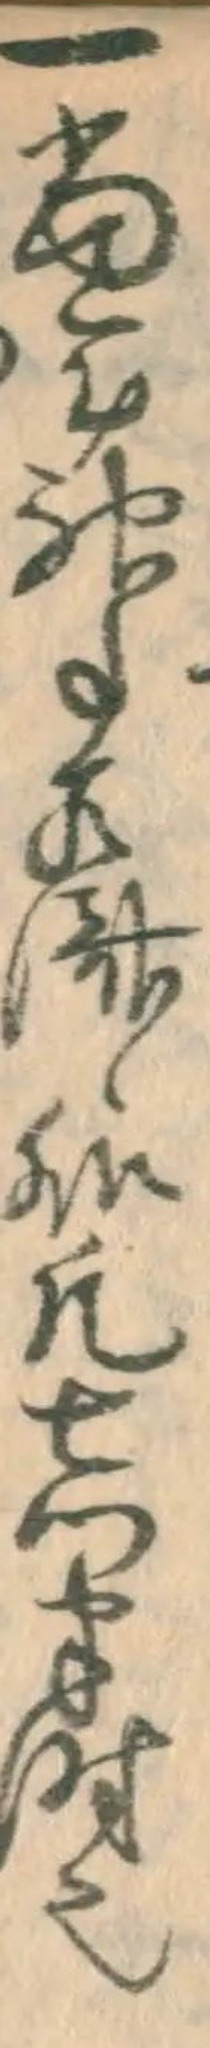一当年神事相済候処凡七ツ半時也
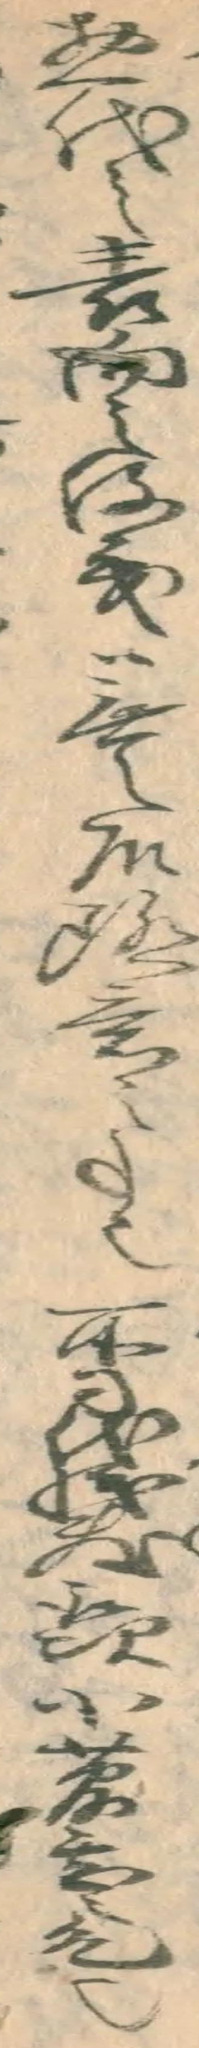惣代之表向之役義ハ無之故随意之事也所司代桟敷取次小菅甚之允也
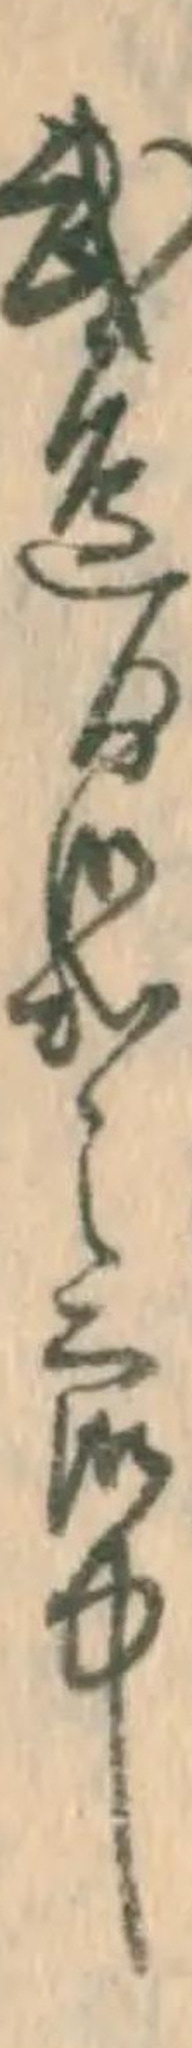武辺ゟ御出之衆中
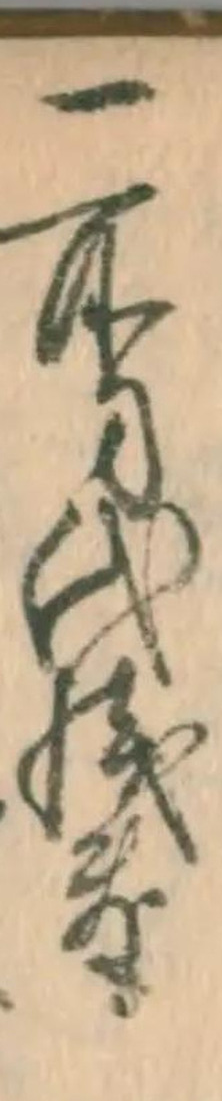一所司代桟敷
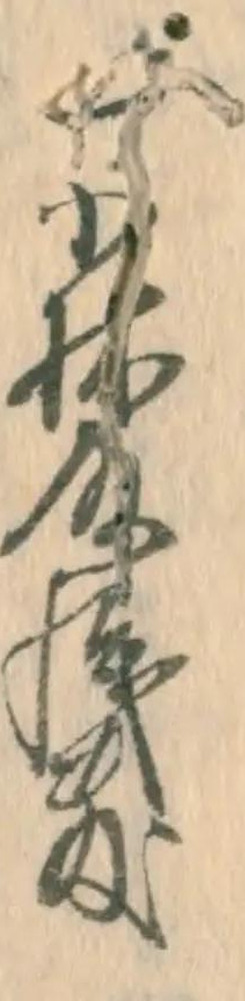一小林殿桟敷
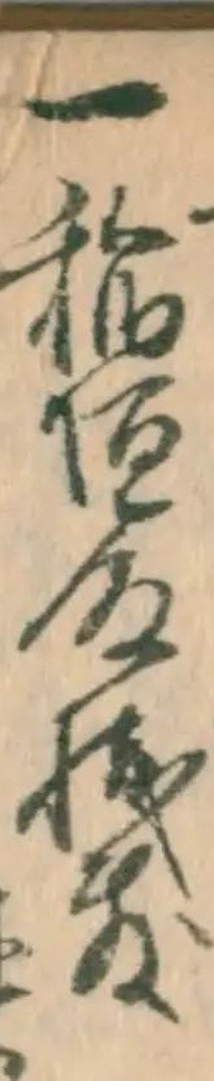一稲垣殿桟敷
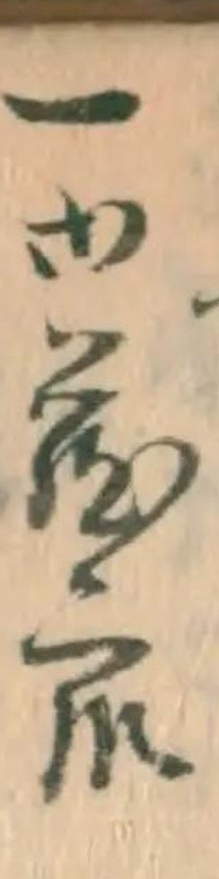一御蔵衆
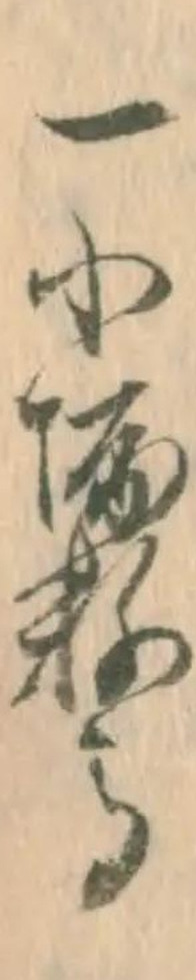一小堀数馬
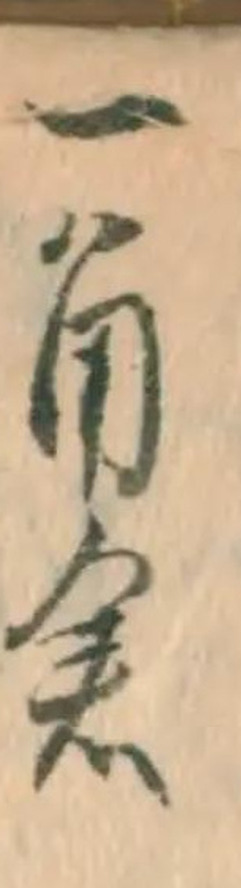一角倉
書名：賀茂社記録. 第58冊
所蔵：国立国会図書館 National Diet Library, JAPAN
